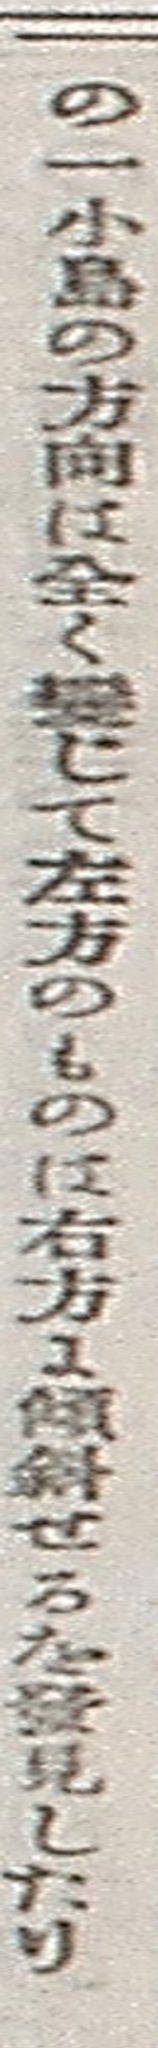の一小島の方向は全く変じて左方のものは右方に傾斜せるを発見したり
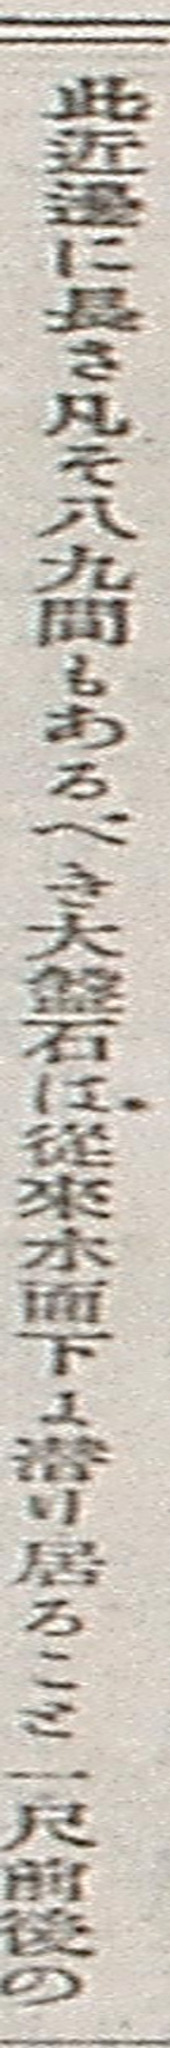此近辺に長さ凡そ八九間もあるべき大磐石は従来水面下に潜り居ること一尺前後の
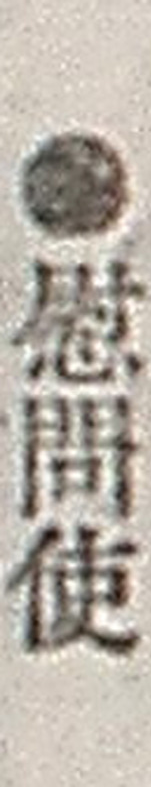●慰問使
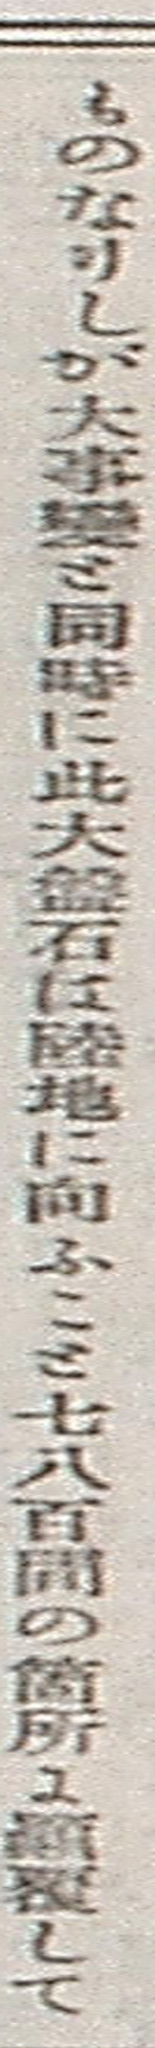ものなりしが大事変と同時に此大磐石は陸地に向ふこと七八百間の箇所に顛覆して
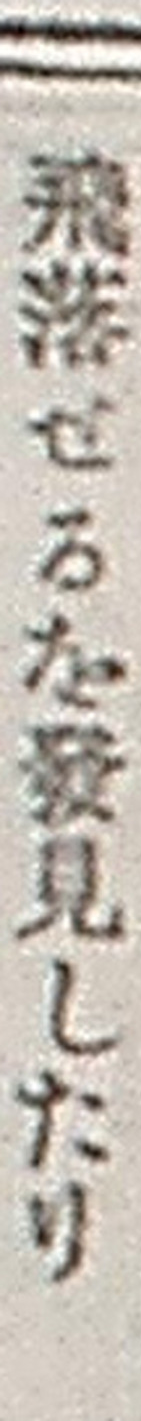飛落せるを発見したり
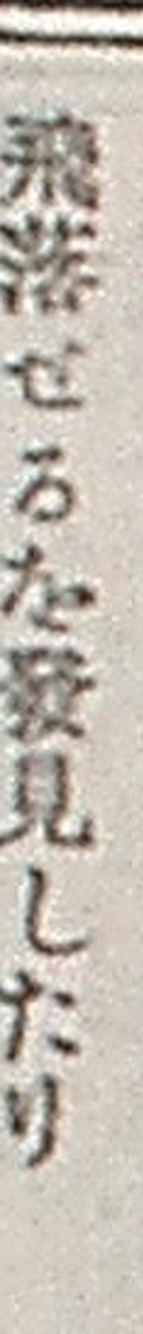飛落せるを発見したり
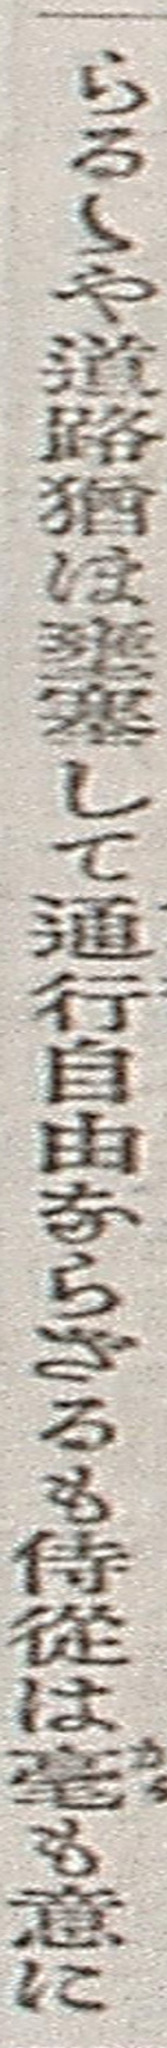らるゝや道路猶ほ壅塞して通行自由ならざるも侍従は毫も意に

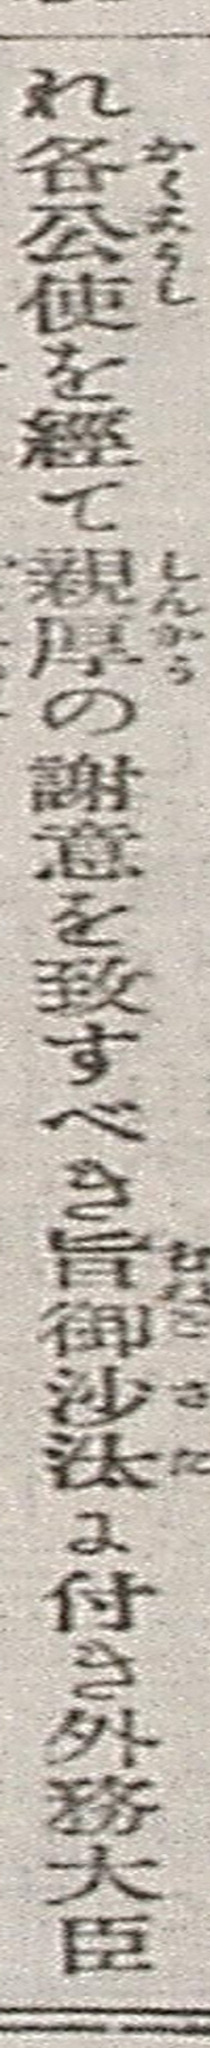れ各公使を経て親厚の謝意を致すべき旨御沙汰に付き外務大臣
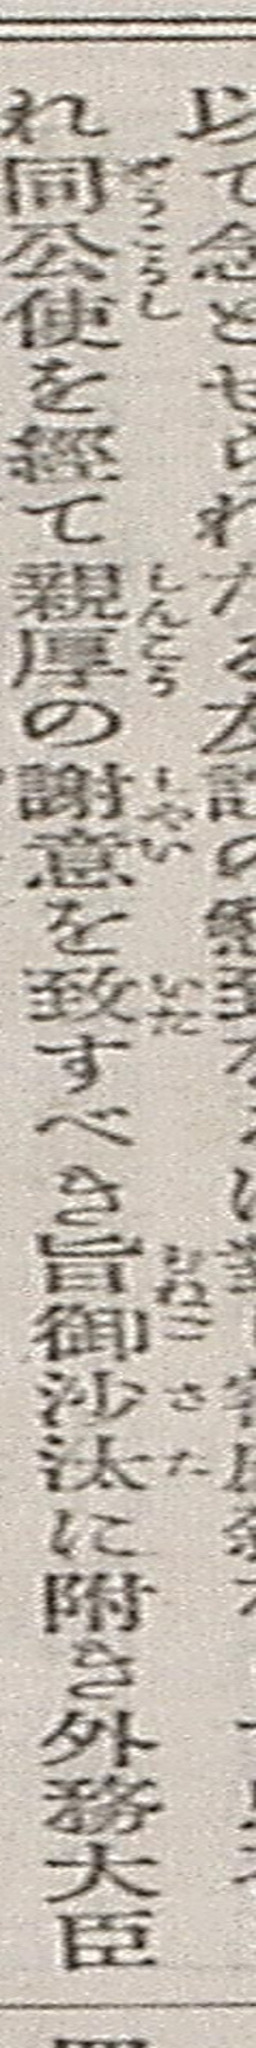れ各公使を経て親厚の謝意を致すべき旨御沙汰に付き外務大臣

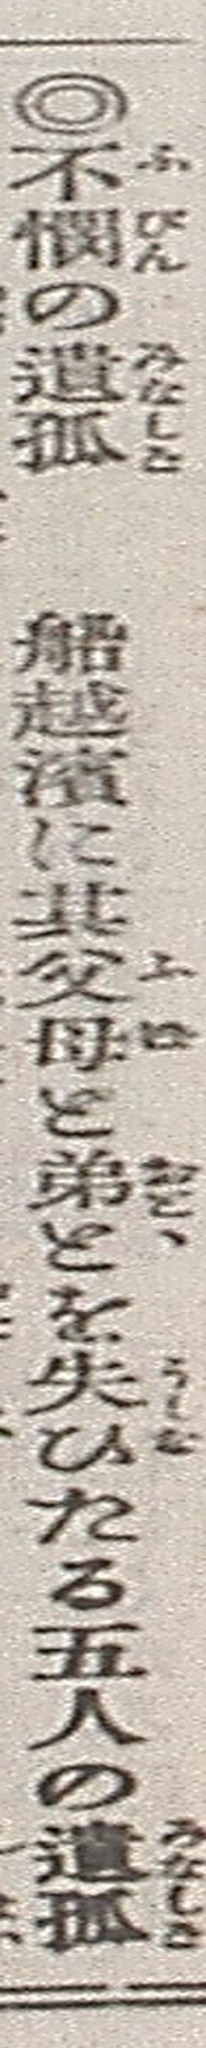◎不憫の遺孤船越浜に其父母と弟とを失ひたる五人の遺孤
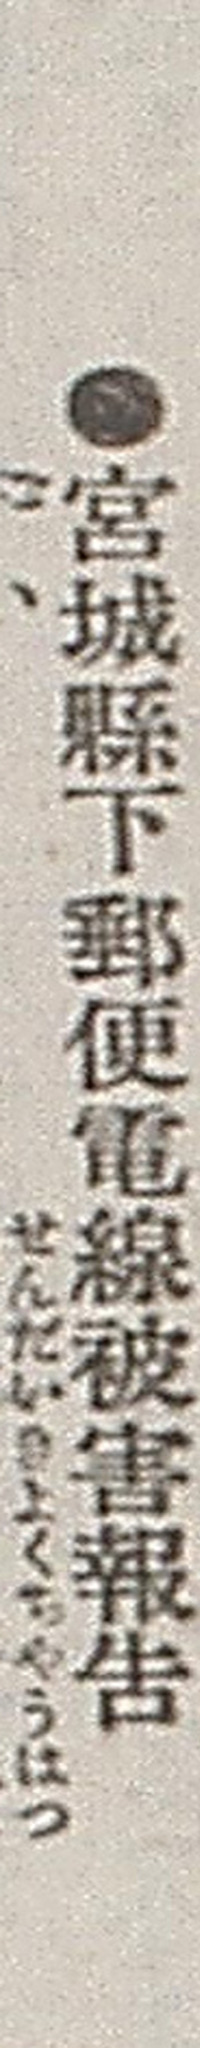●宮城県下郵便電線被害報告
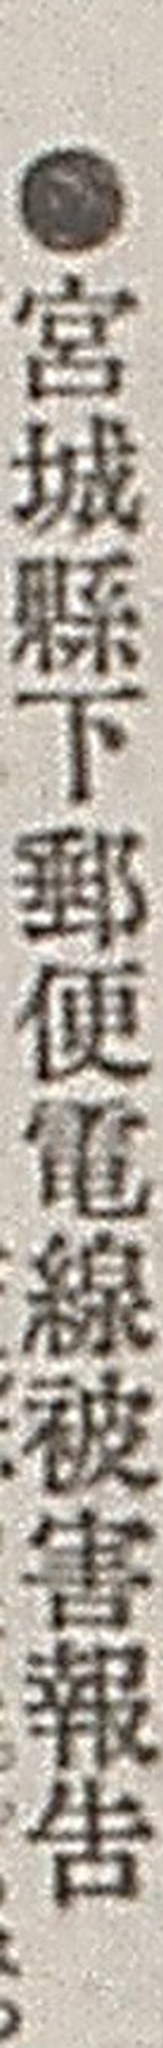●宮城県下郵便電線被害報告
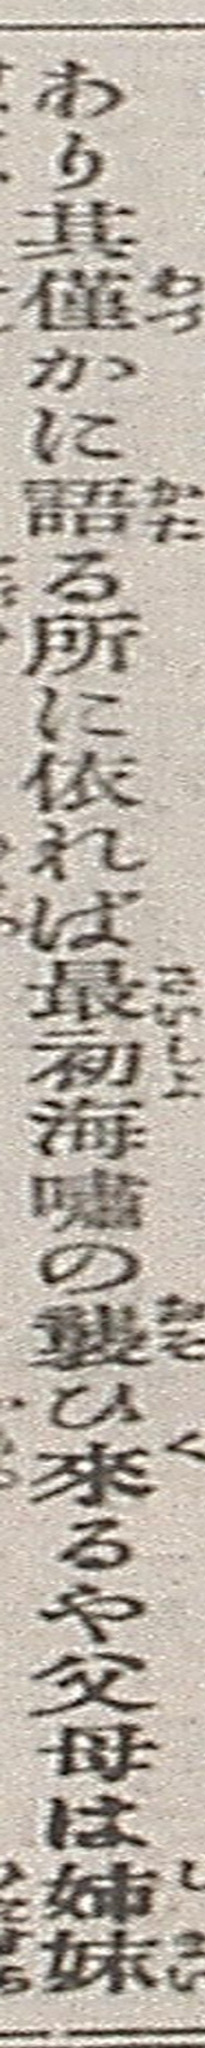あり其僅かに語る所に依れば最初海嘯の襲ひ来るや父母は姉妹
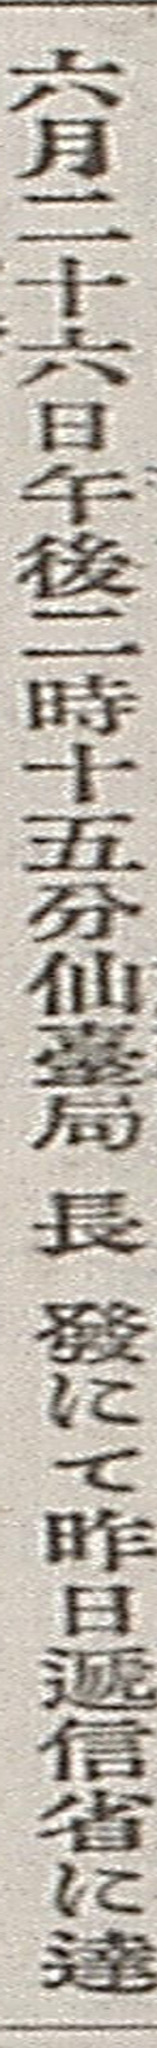六月二十六日午後二時十五分仙台局長発にて昨日逓信省に達
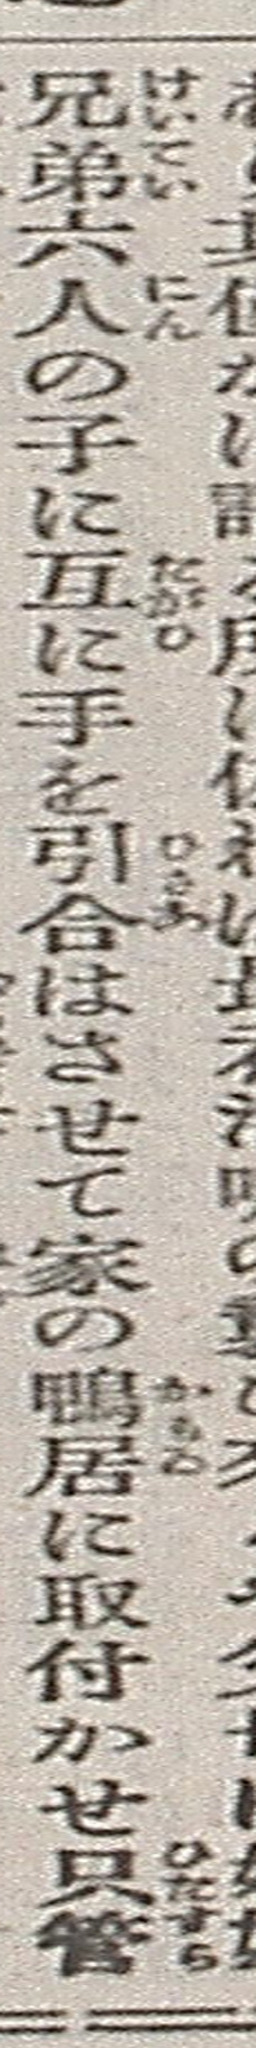兄弟六人の子に互に手を引合はさせて家の鴨居に取付かせ只管
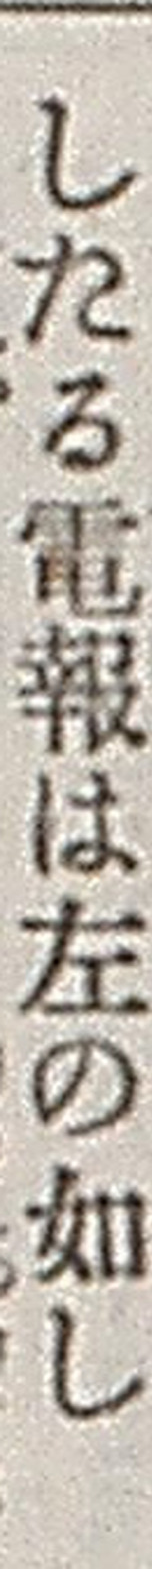したる電報は左の如し
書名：風俗畫報臨時増刊第百十九號　大海嘯被害録（中）
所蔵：東京大学地震研究所図書室 Earthquake Research Institute Library, The University of Tokyo, JAPAN
